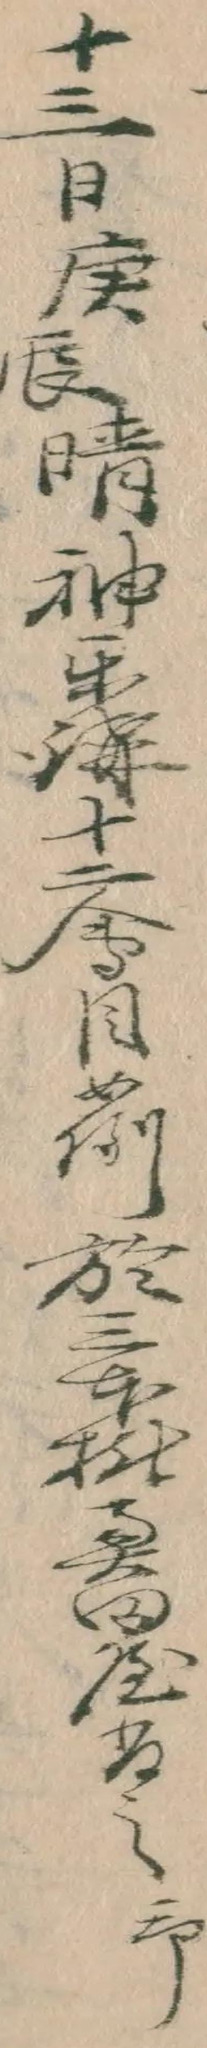十三日庚寅晴神楽講十二會目如例於三本拵奥田屋有之予
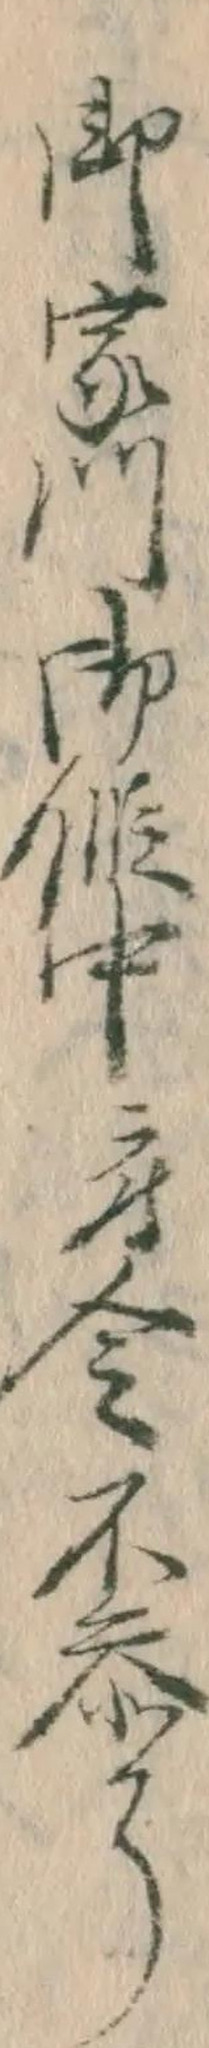御家門御暇中ニ付令不参了
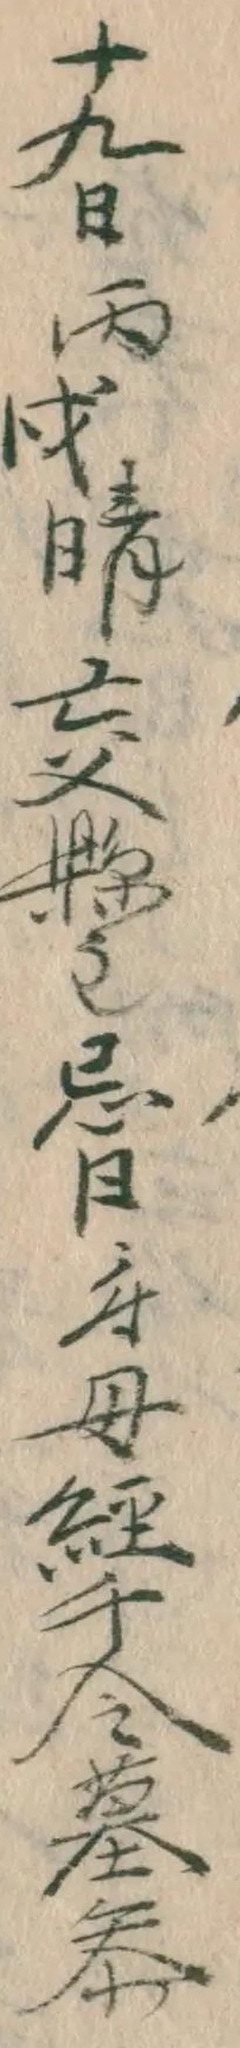十九日丙戌晴亡父縣主忌日ニ付母経千令墓参
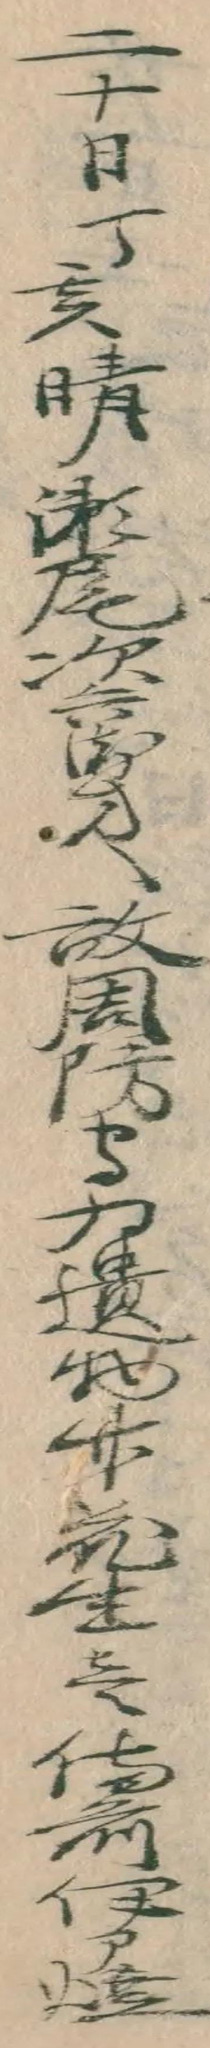二十日丁亥晴瀬尾次兵衛方へ故周防守為遺物竹花生壱備前伊藤雄
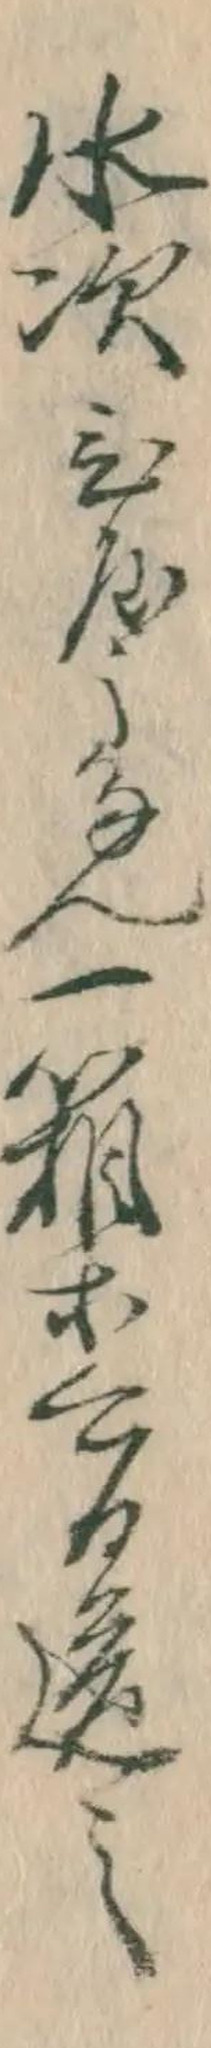水次ひやうたん一箱等今日遣也
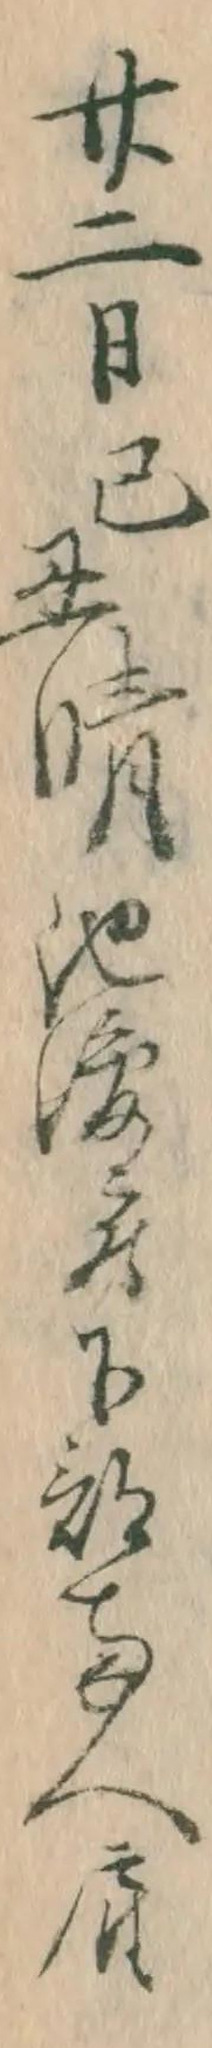廿二日己丑晴池浚ニ付下部両人雇

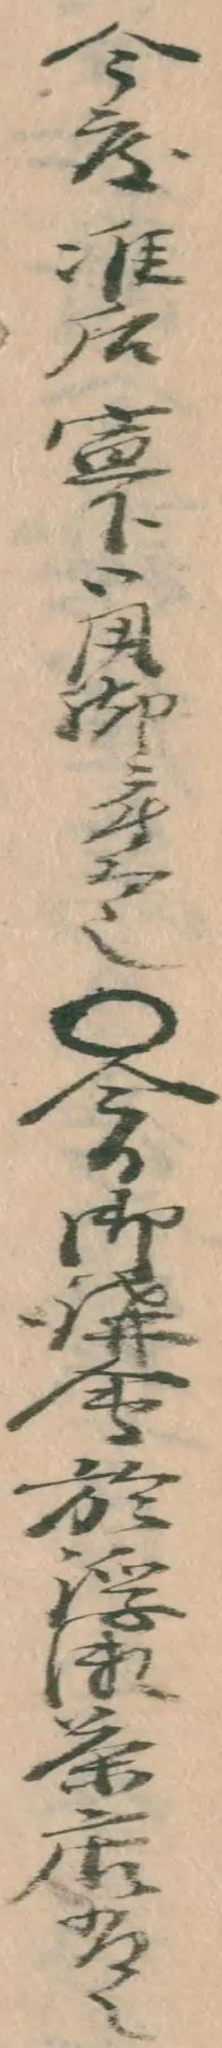今度准后宣下御用脚ニ付而也○今日御講會於浮瀬茶店有之
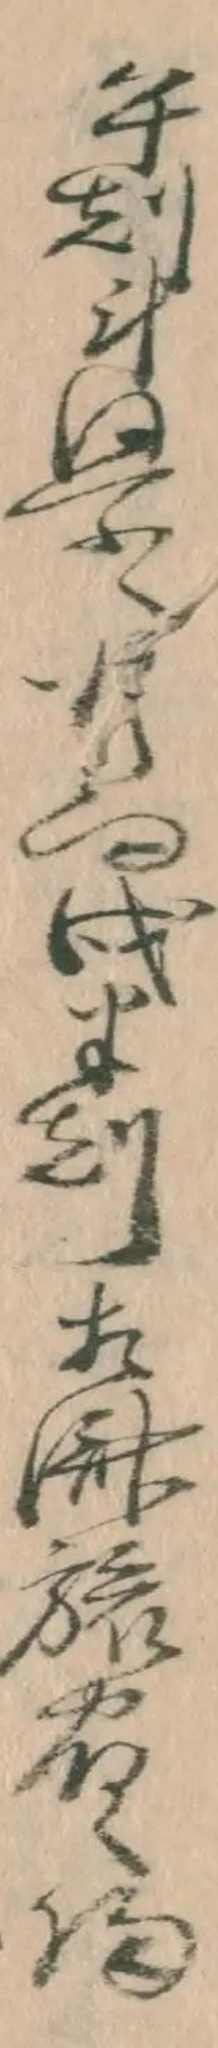午刻斗向所向戌半刻相済旅宿へ帰
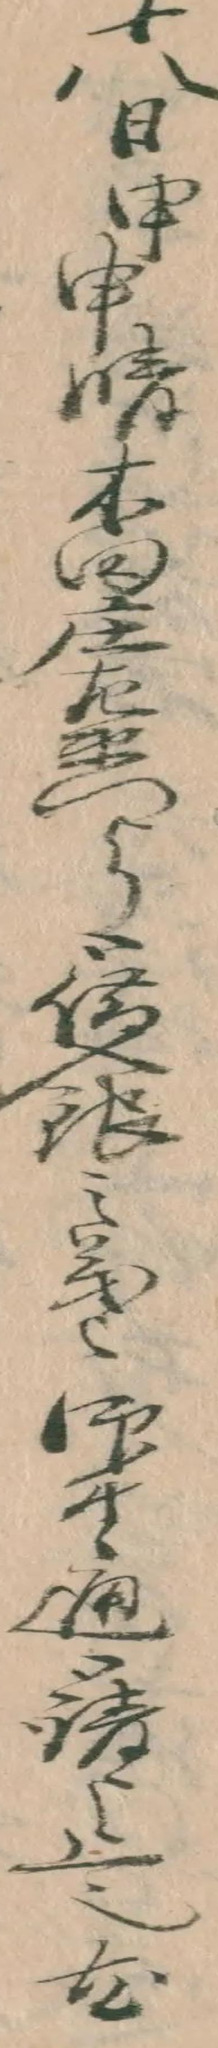十八日甲申晴木田庄左衛門より御借人銀之義被仰付候通御請申上也尤
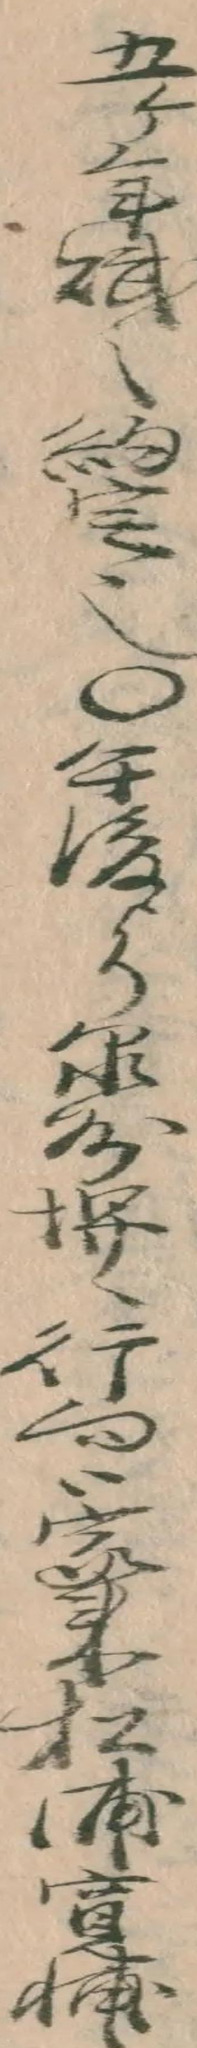五ヶ年賦之約定也○午後より能州堺へ行向御家来松浦寛輔
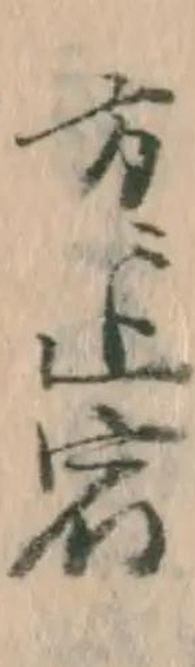方ニ止宿
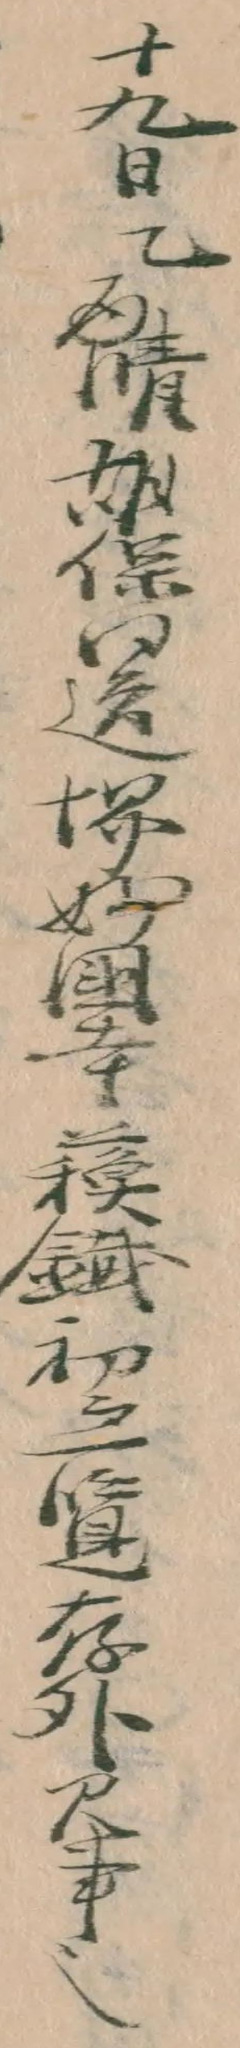十九日乙酉晴胡保同道堺妙國寺蘇鉄初而一覧存外見事也
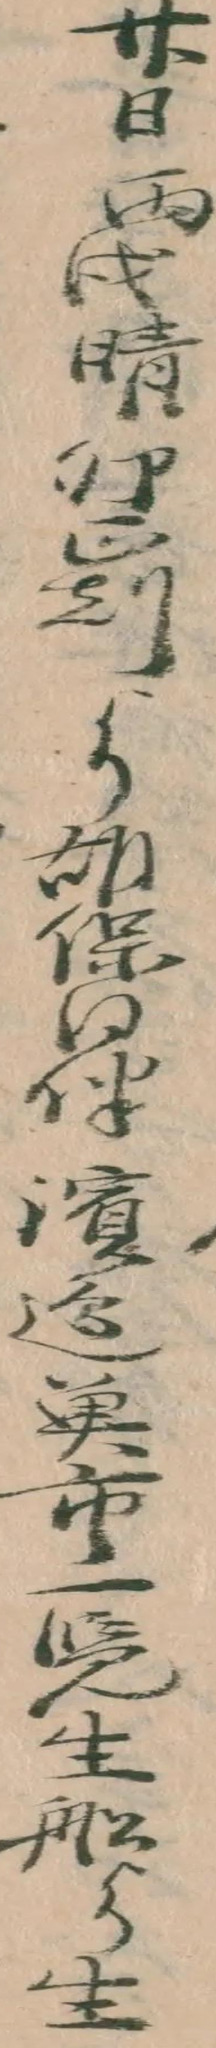廿日丙戌晴卯正刻より胡保同伴濱邊魚市一覧生舩より生
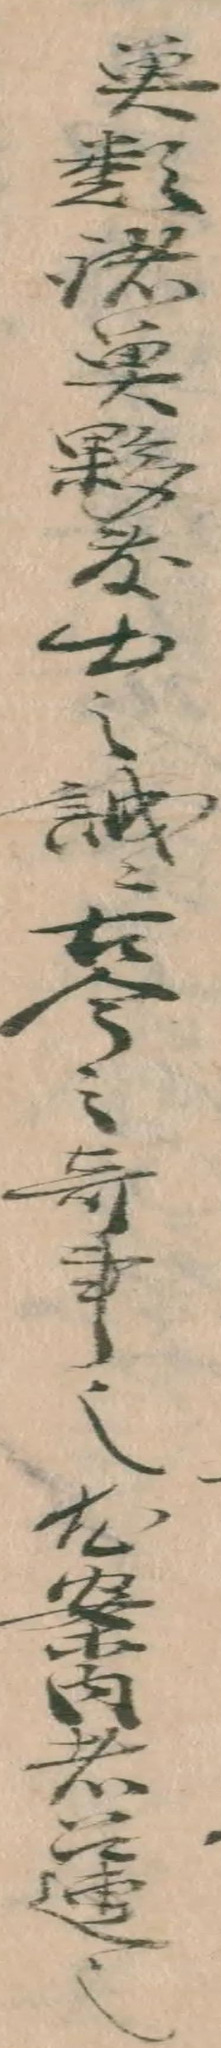魚類諸魚夥敷出之誠ニ古今之奇事也尤案内者召連也
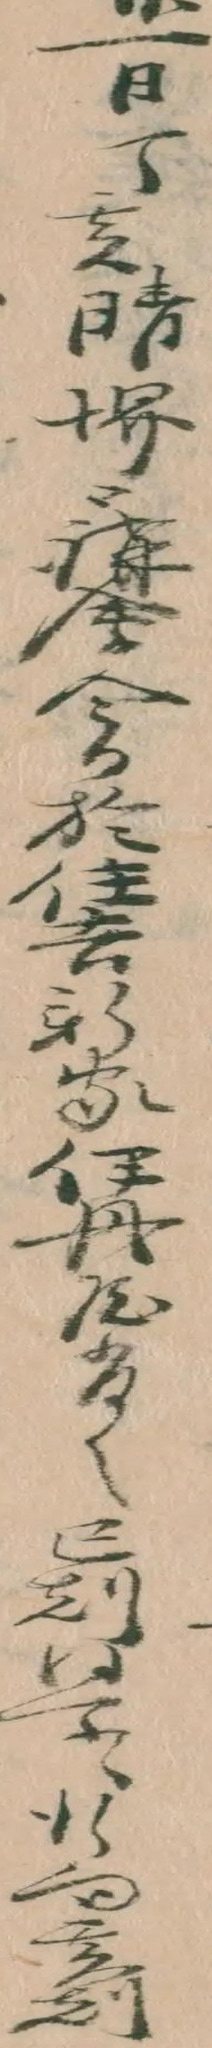廿一日丁亥晴堺御構會今日於住吉新家伊丹屋有之巳刻同所へ行向亥刻
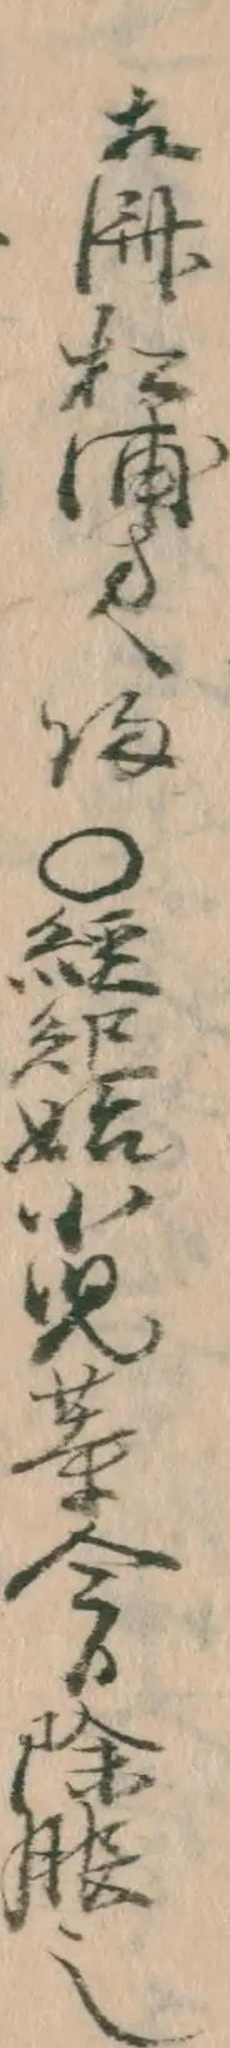相済松浦方へ帰○経紀始小児等今日除服也
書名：賀茂社記録. 第65冊
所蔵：国立国会図書館 National Diet Library, JAPAN
